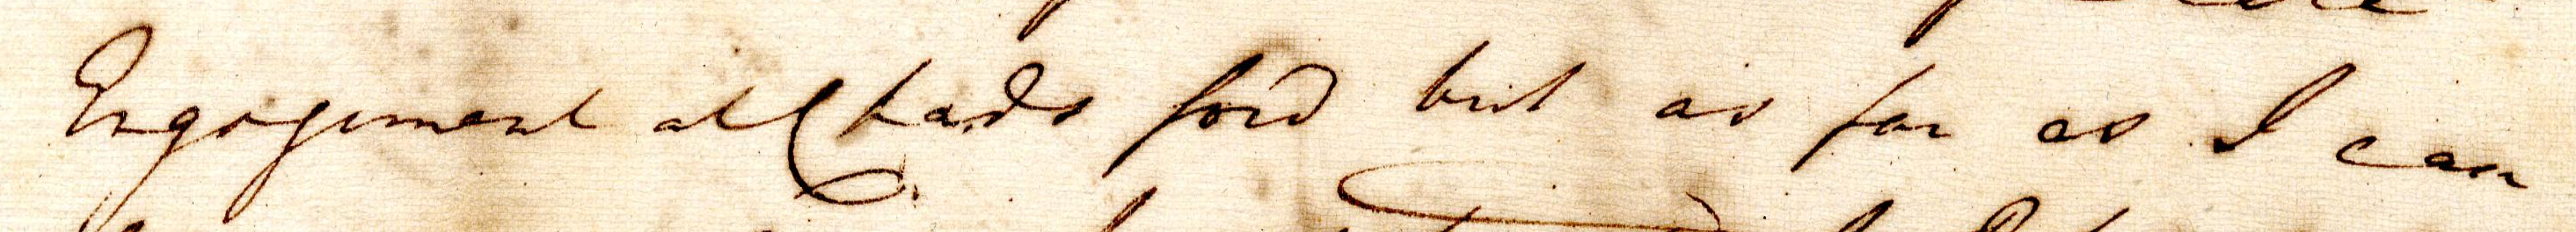Engagement at Chads ford but as far as I can
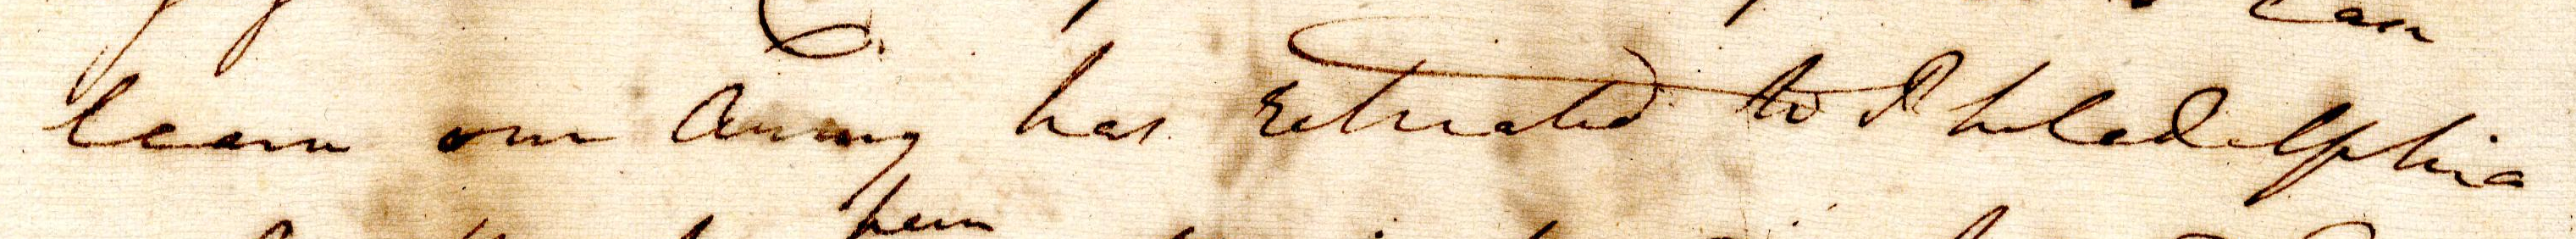learn our Army has retreated to Philadelphia
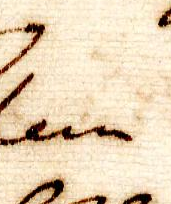been
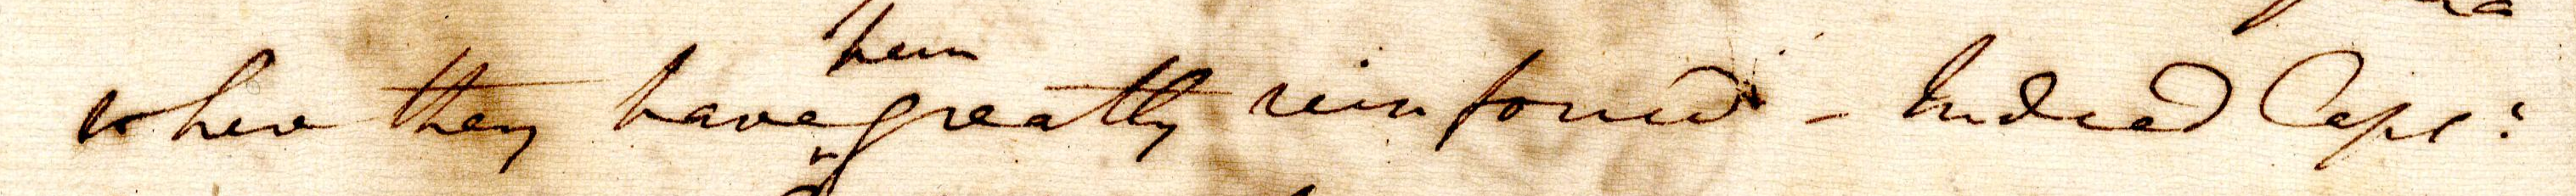where they have ^been greatly reinforced- Indeed Capt.
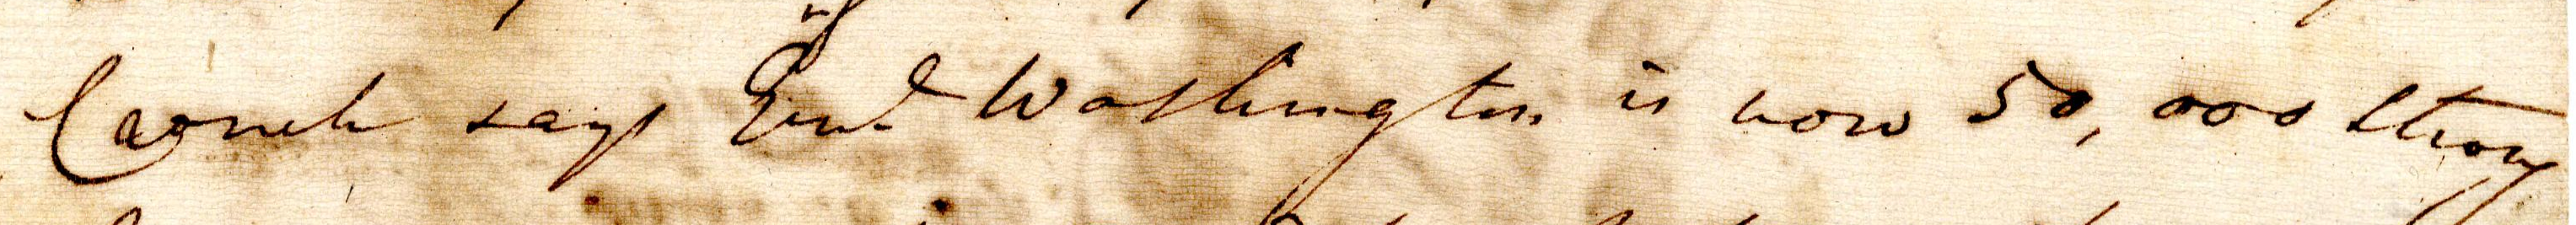Caouch says Gen^l. Washington is now 50,000 strong
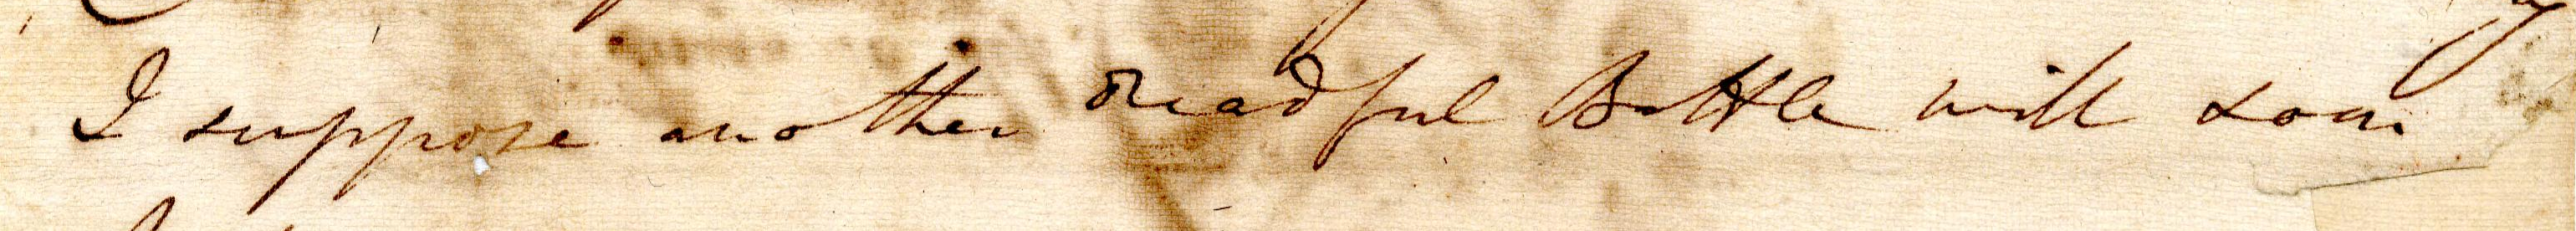I suppose another dreadful Battle will soon
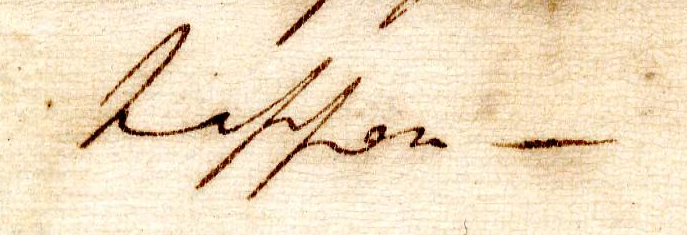happen-
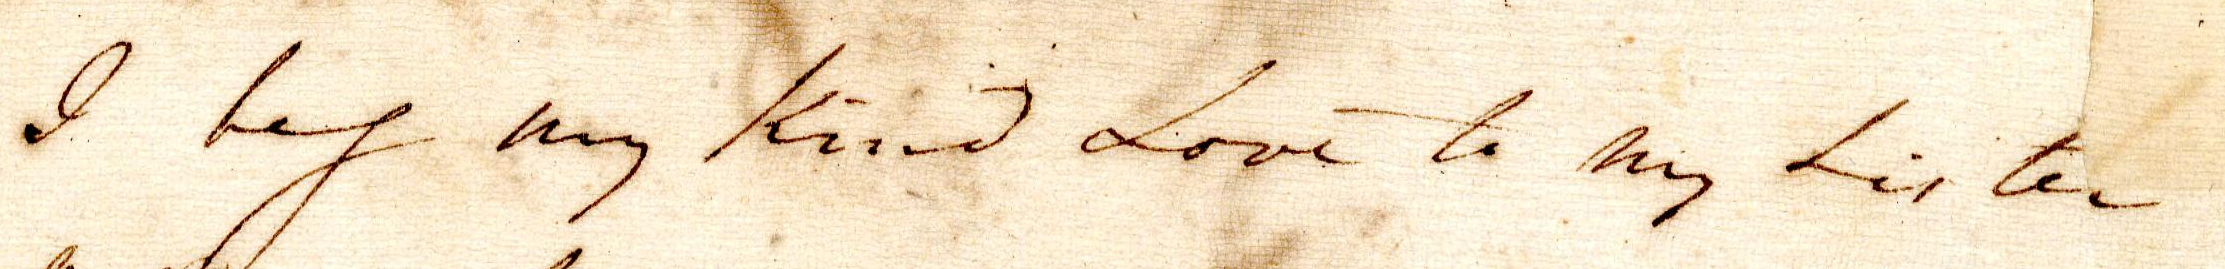I beg my kind Love to my Sister
